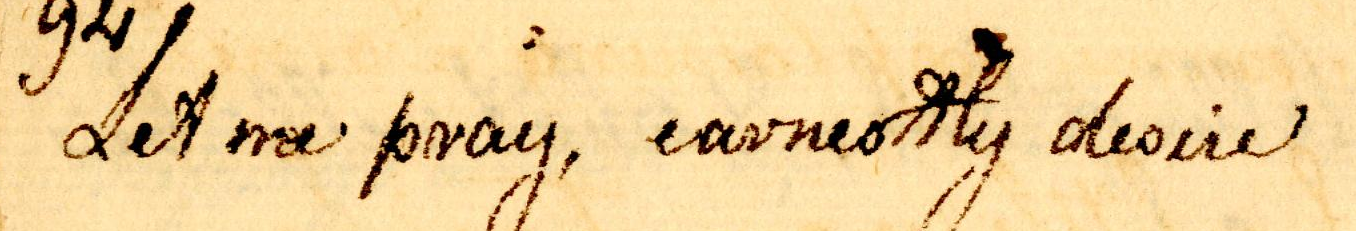Let me pray, earnestly desire
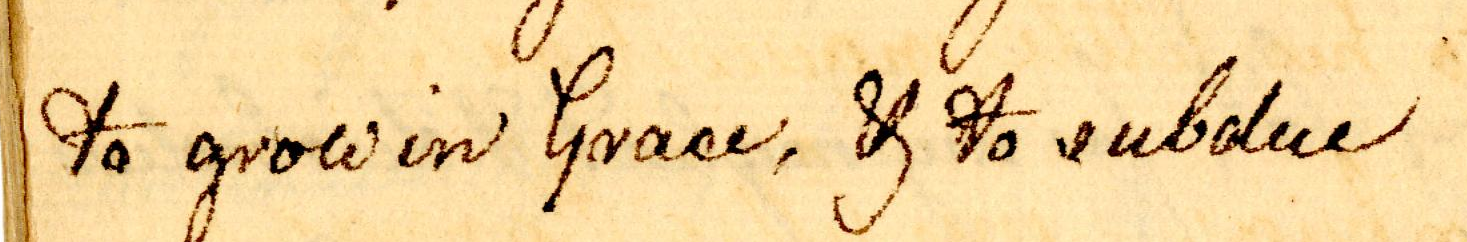to grow in Grace, & to subdue
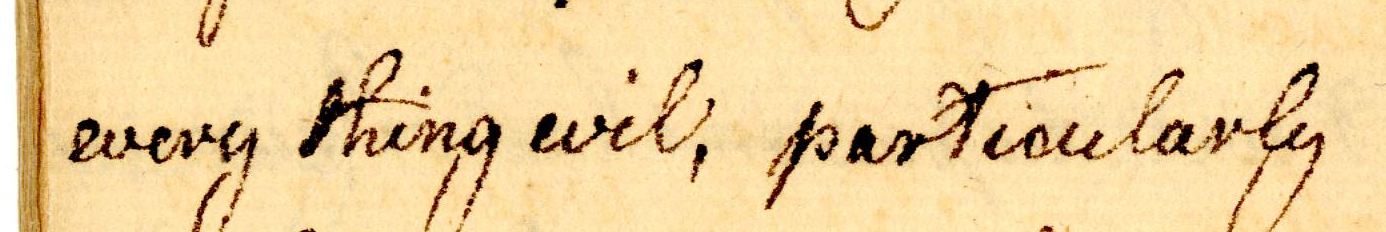every thing evil, particularly
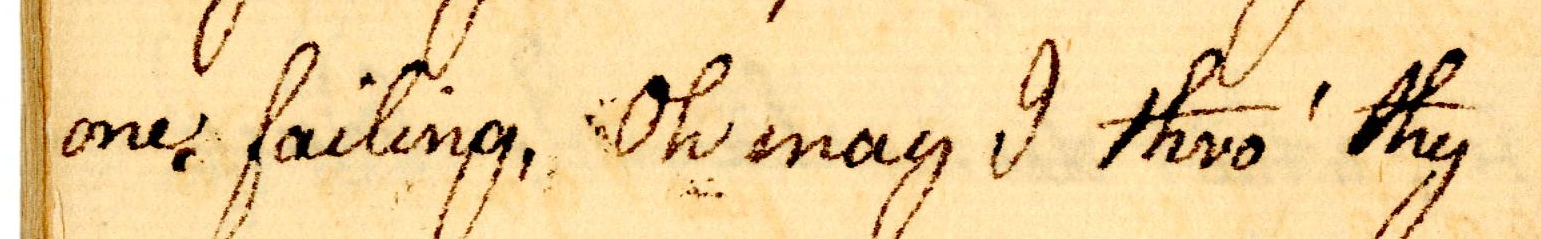one failing, Oh may I thro' thy
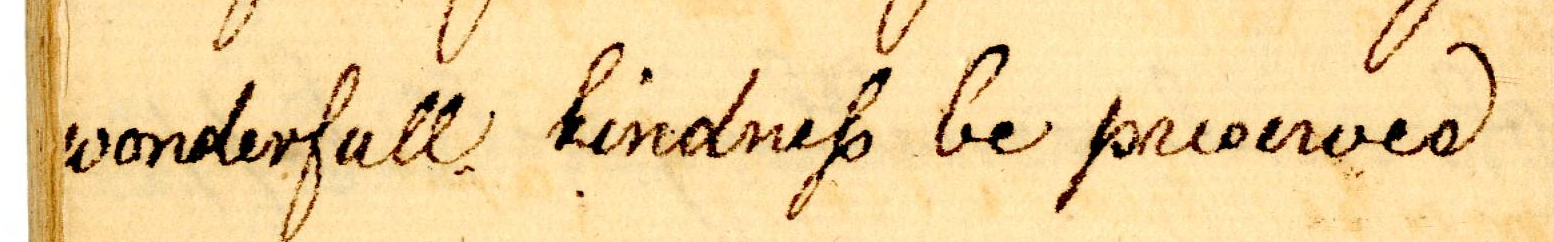wonderfull kindness be preserved
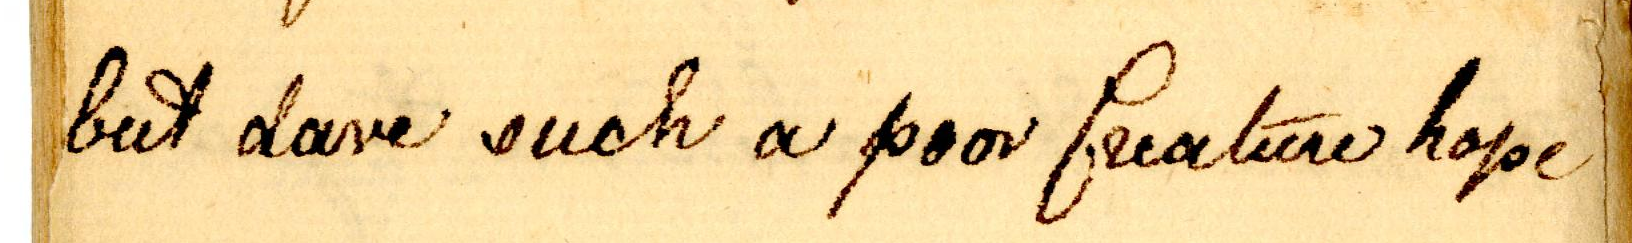but dare such a poor Creature hope
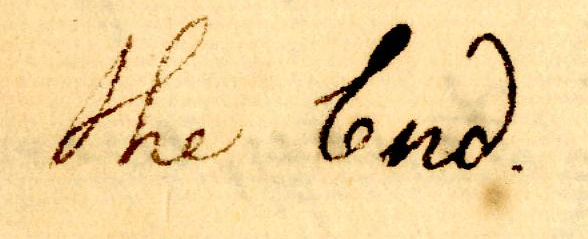the End.
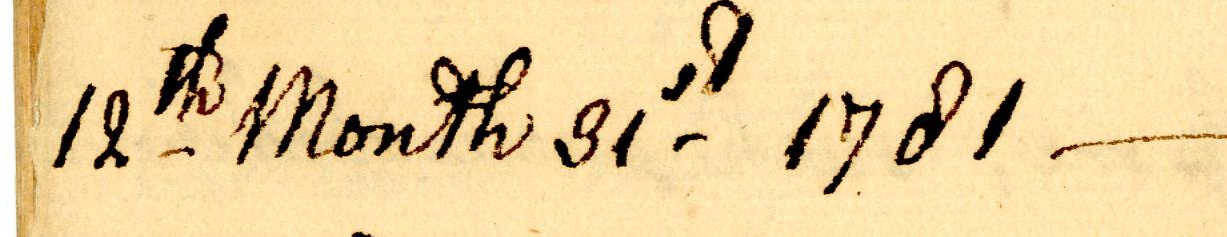12^th Months 31^st- 1781-
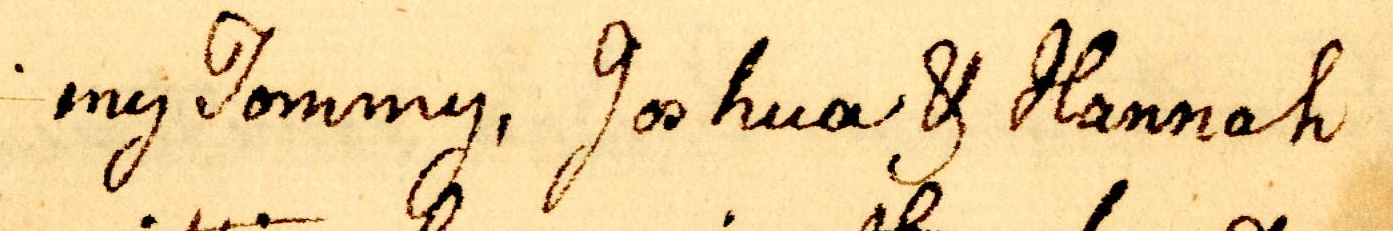my Tommy, Joshua & Hannah
